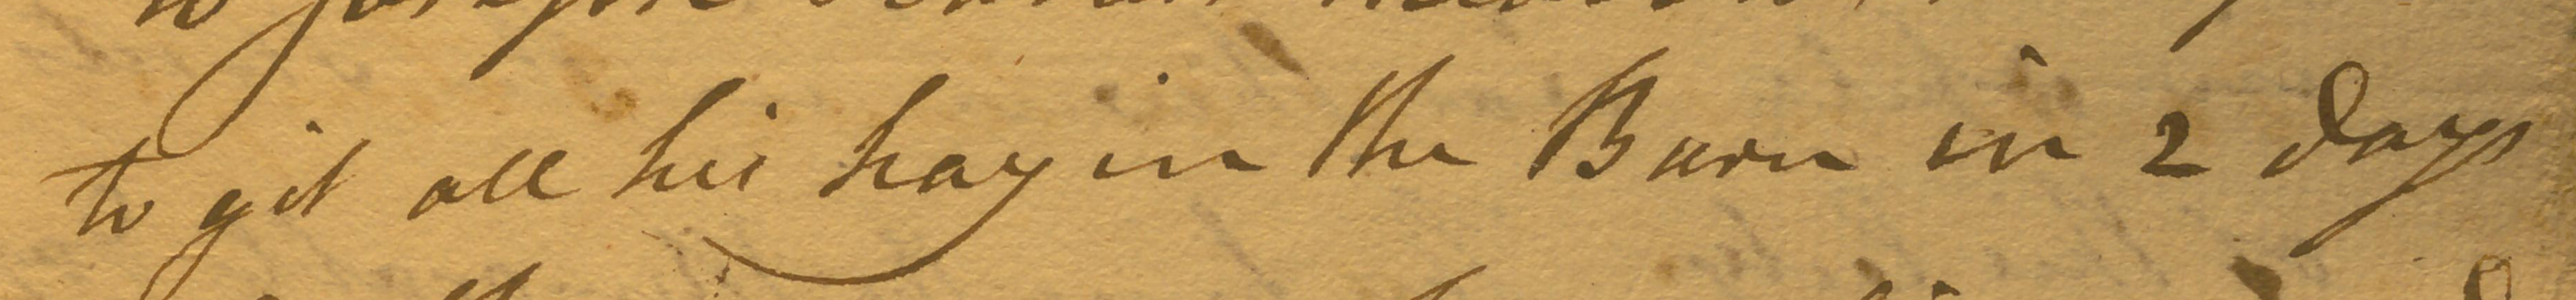to get all his hay in the Barn in 2 days
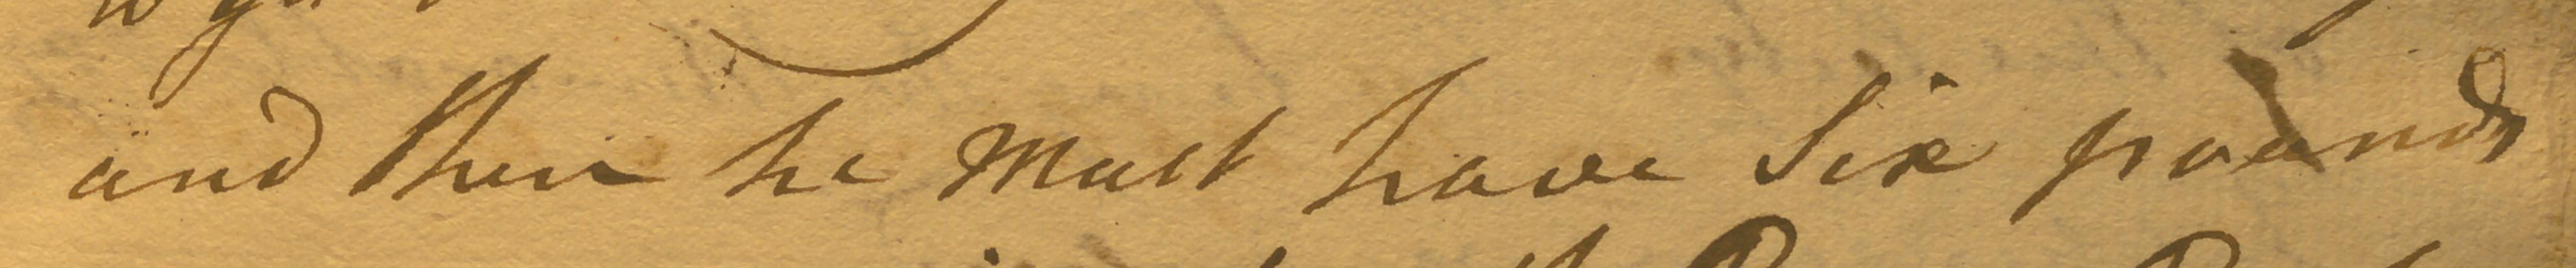and then he must have six pounds
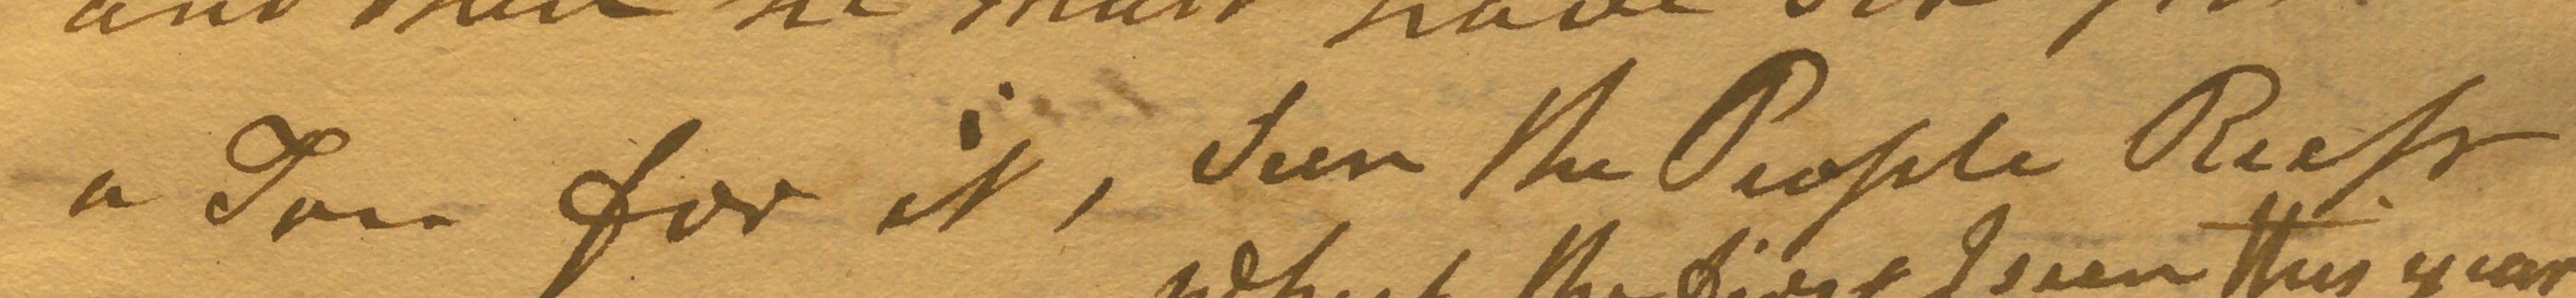a Ton for it, seen the People Reep
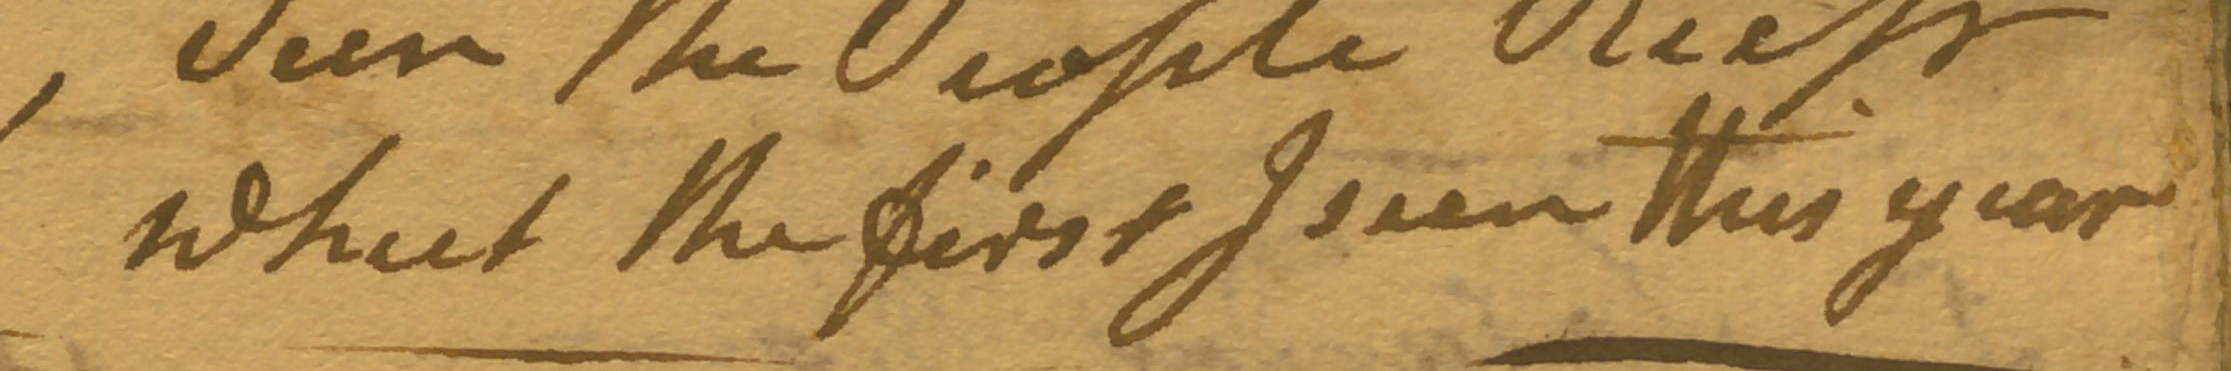wheet the first I seen this year
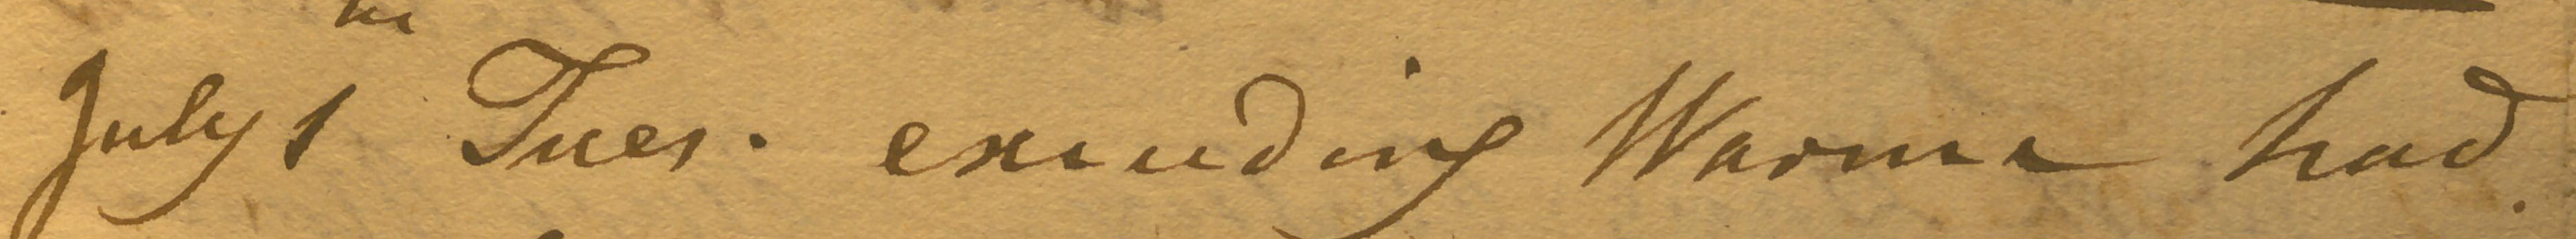July 1 Tues: exieeding Warme had
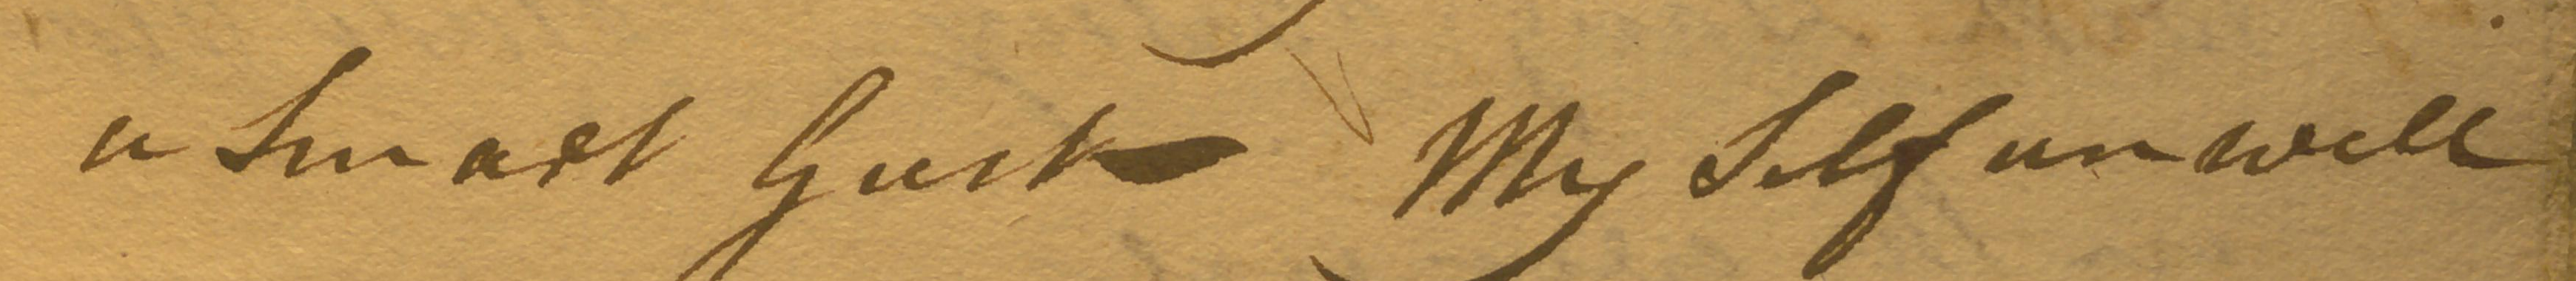a smart Gust My self unwell
